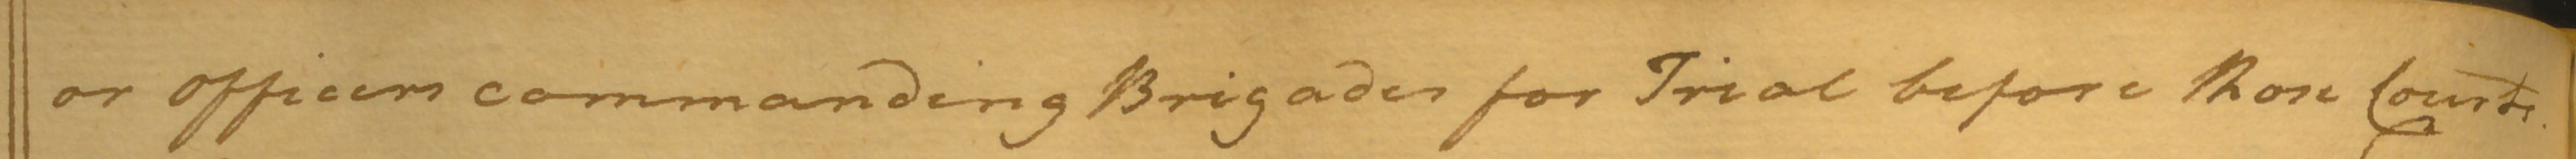or officers commanding Brigades for Trial before those Courts
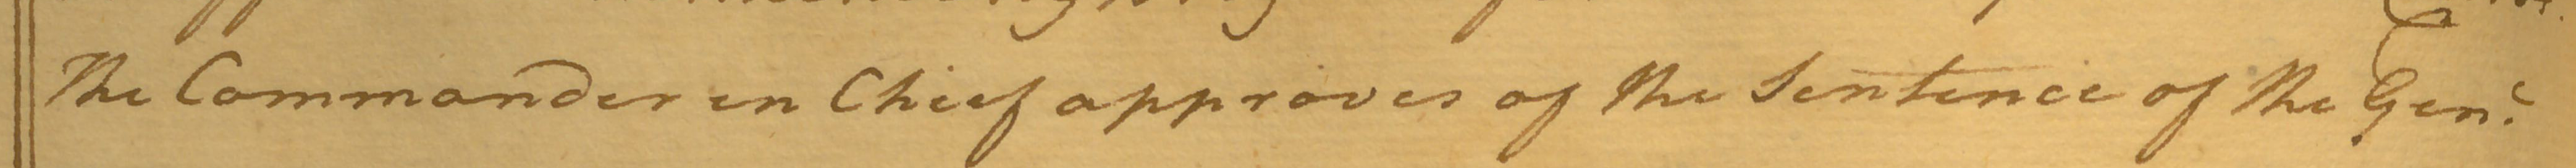The Commander in Chief approves of the Sentence of the Gen^l.
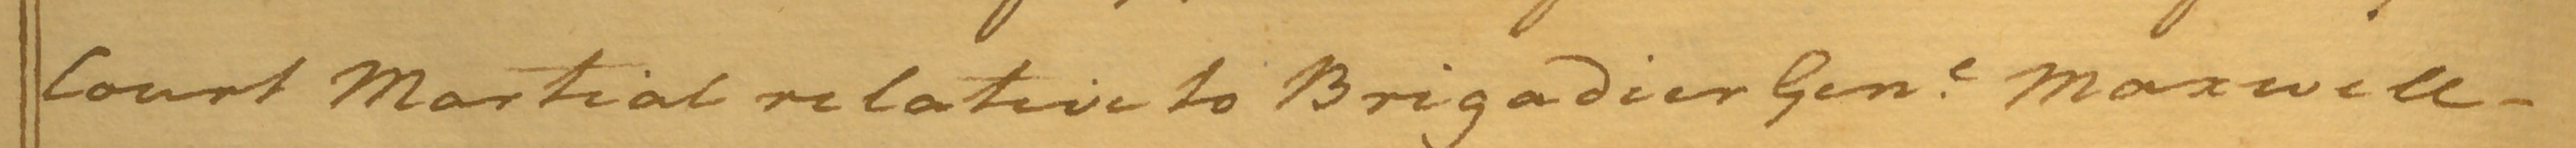Court Martial relative to Brigadier Gen^l. Maxwell-
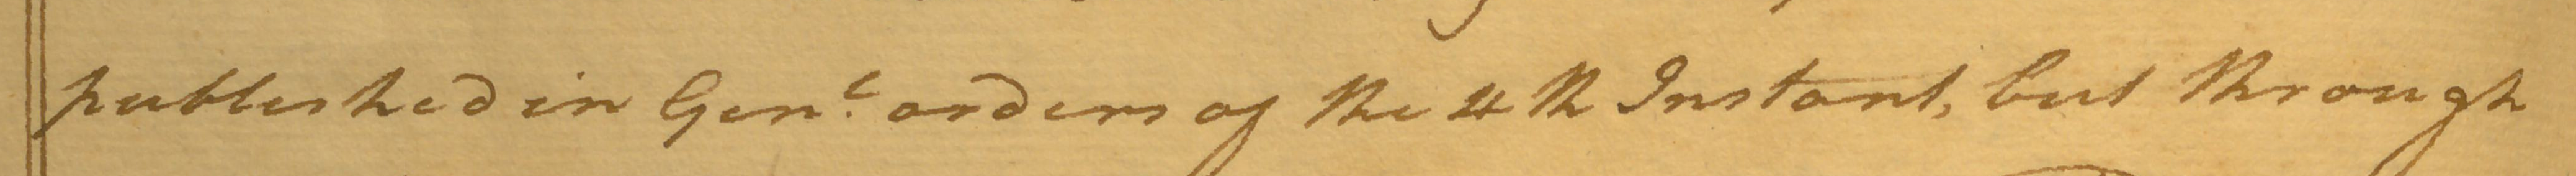published in Gen^l. orders of the 4th Instant, but through
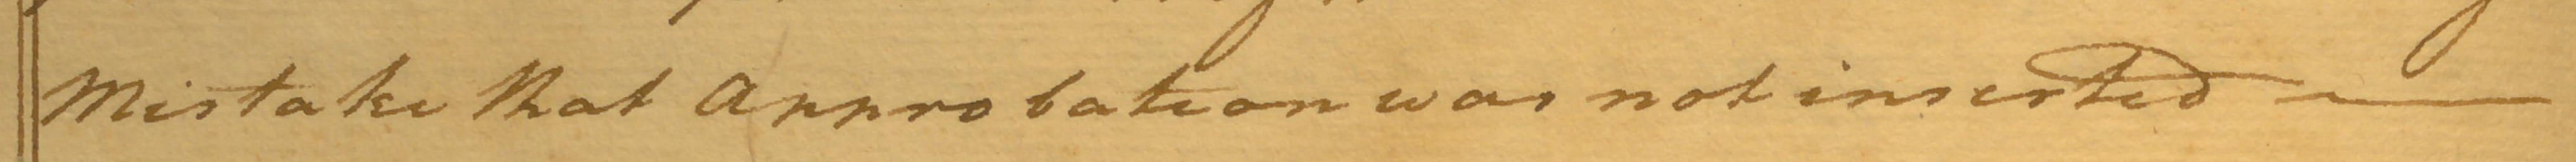Mistake that approbation was not inserted-
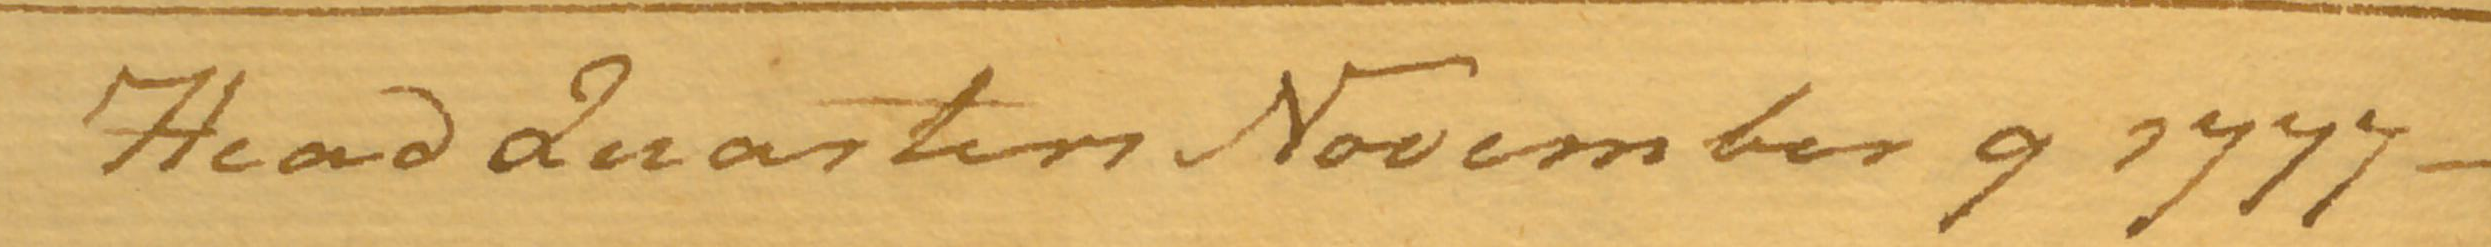Head Quarters November 9 1777-
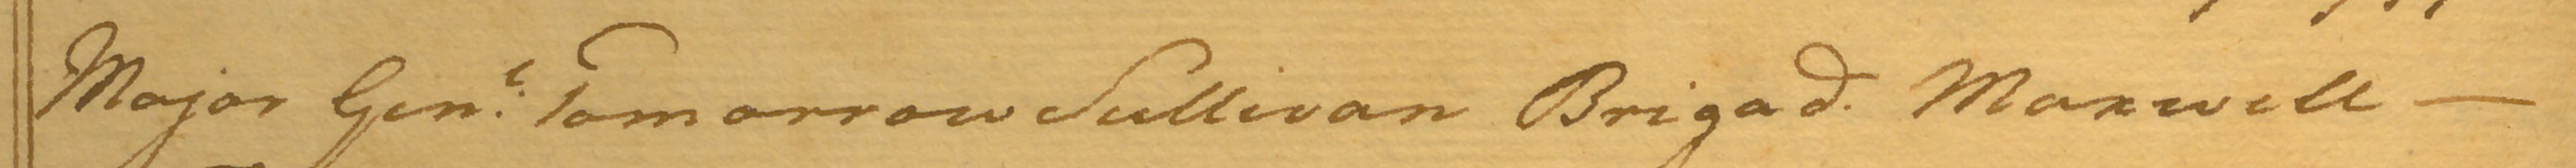Major Gen^l. Tomorrow Sullivan Brigad. Maxwell-
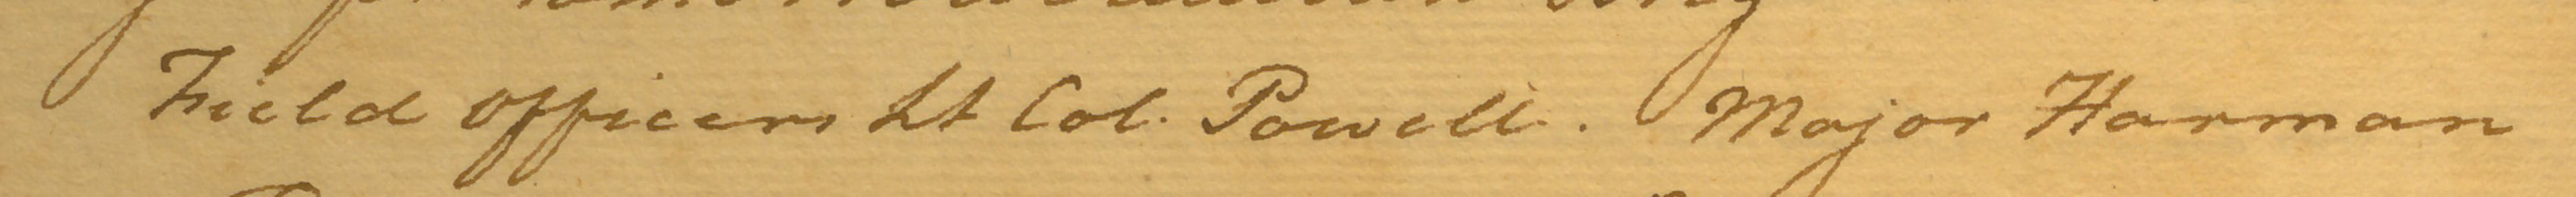Field officers Lt Col. Powell. Major Harman
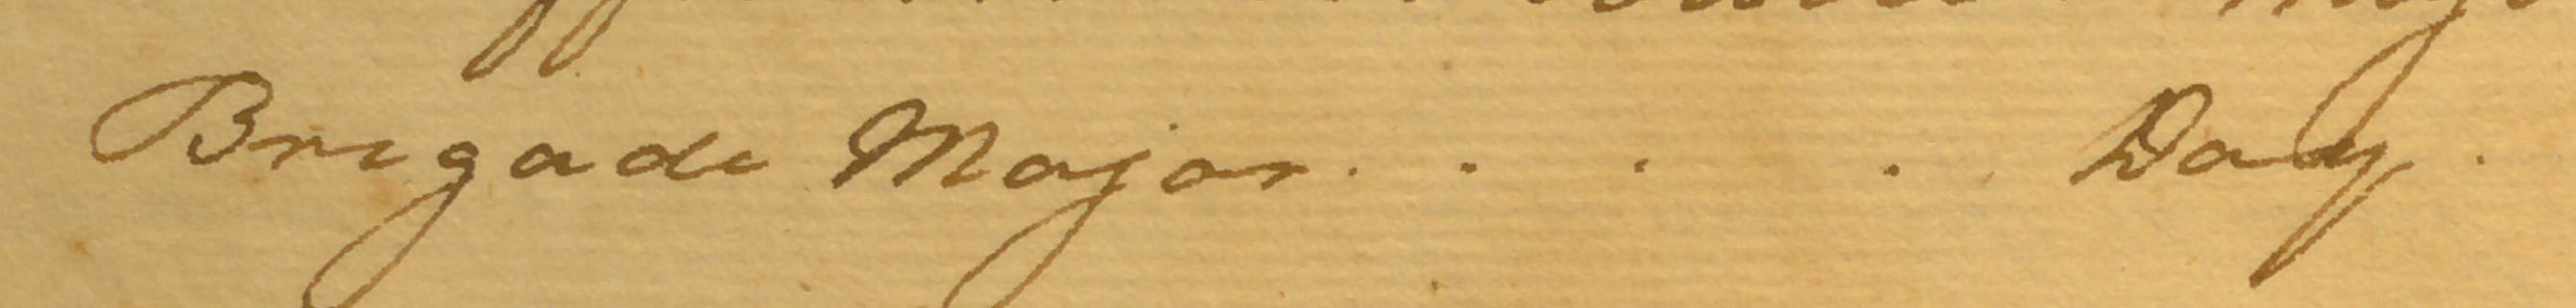Brigdae Major. ... Day
